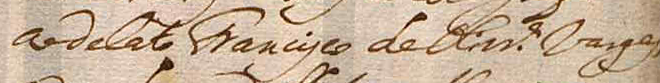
ao delato Francisco de Olivr.a Vargas,
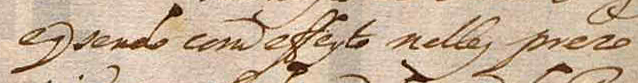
e q̄ sendo com effeyto nelles prezo
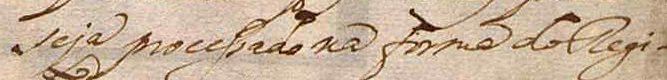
seja processado na forma do Regi
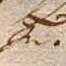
m.to
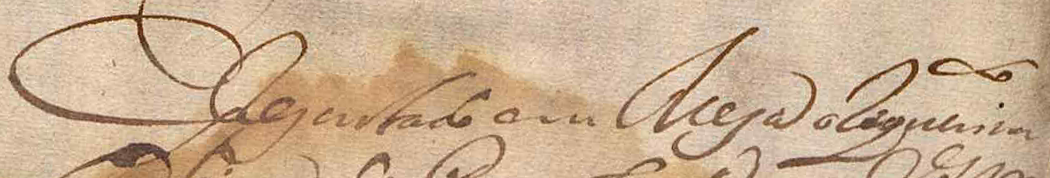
E prezentado em Meza o Requerimto
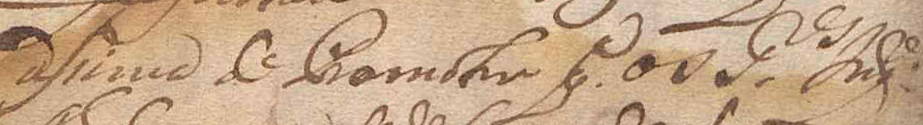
assima do Promotor p.a os S.res Inq.res
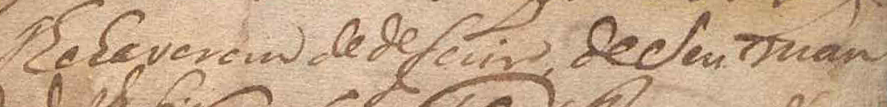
lhe haverem de deferir, de Seu man
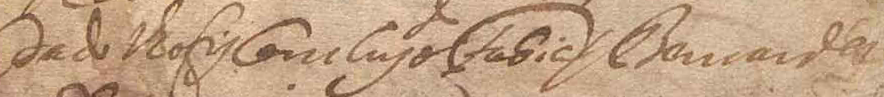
dado lho fis Concluzo Fabiaõ Bernardes
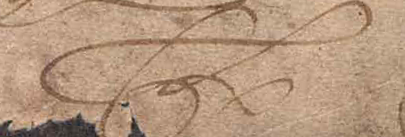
CLo
